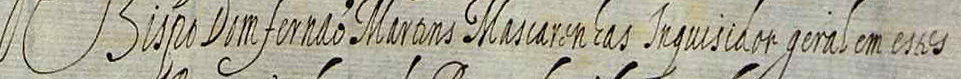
O Bispo Dom fernaõ Martins Mascarenhas Inquisidor geral em estes
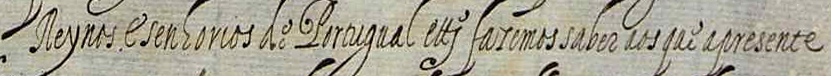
Reynos e senhorios de Portugual ettꝭ fazemos saber aos que a presente
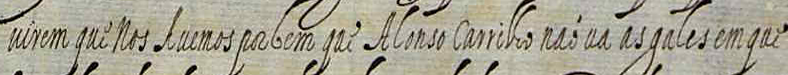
uirem que nos Auemos por bem que Alonso Carrilho naõ ua as gales em que
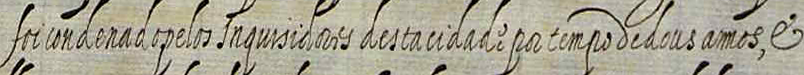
foi condenado pelos Inquisidores desta cidade por tempo de dous annos, E
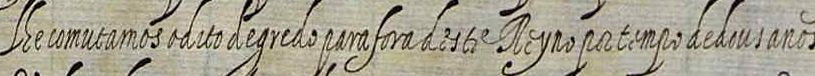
lhe comutamos o dito degredo para fora deste Reyno por tempo de dous anōs
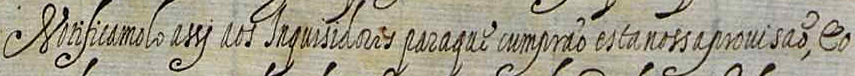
Notificamolo assj aos Inquisidores para que cumpraõ esta nossa prouisaõ, e
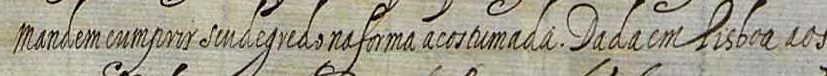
mandem cumprir seu degredo na forma acostumada. Dada em Lisboa aos
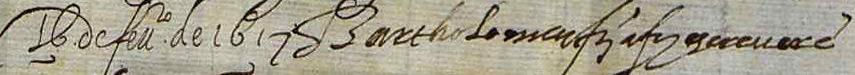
16 de feu.ro de 1617 Bartholomeu frz̄ a fiz escreuer e
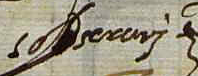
sobscrevj
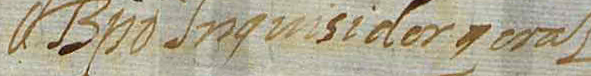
O Bpō Inquisidor geraL
